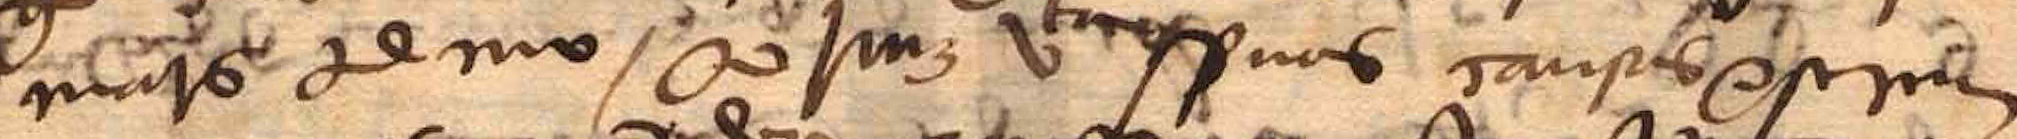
majs t̄mo / e o Juiz vta / suas causas e serem
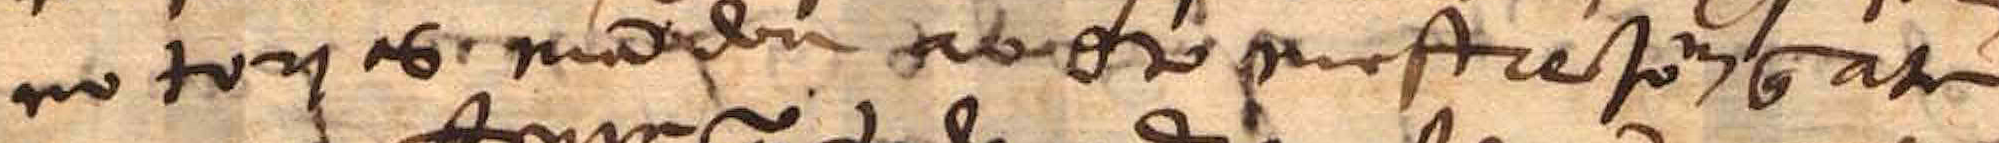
notorjas mādou ao dito mestre Jom q̄ ate
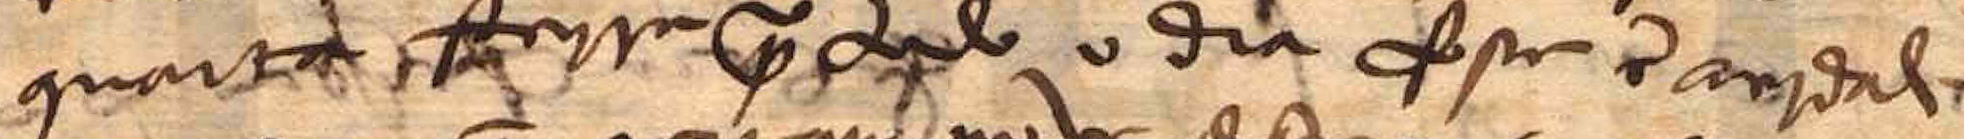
quarta feyra p̄o todo o dia fose ē a cjdade
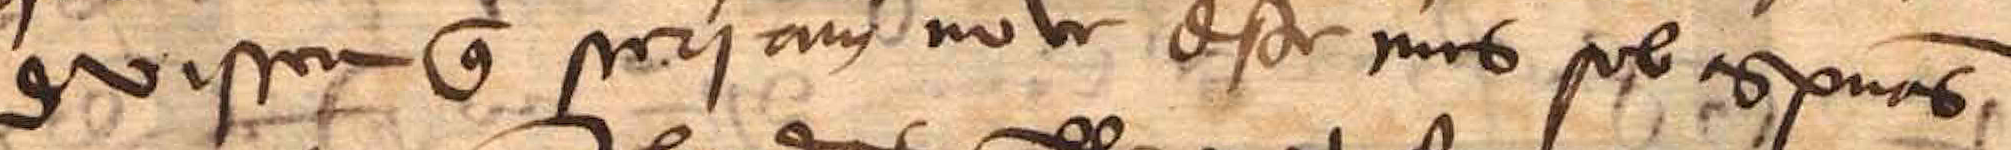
de visseu q̄ serjam nove deste mes sob as pnās
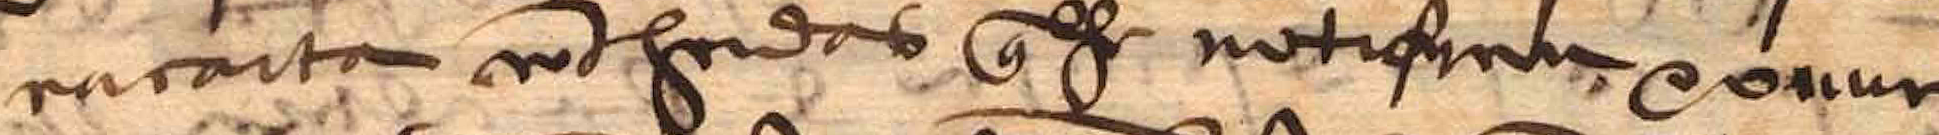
na carta cōtheudas q̄ lhe notificou e ouue
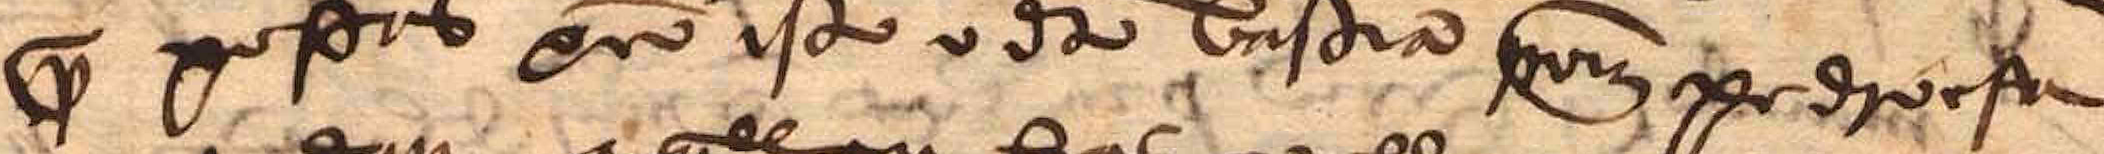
p̄ postas e c̄o isto o dt̄o bastiā r̄roiz pedjo esta
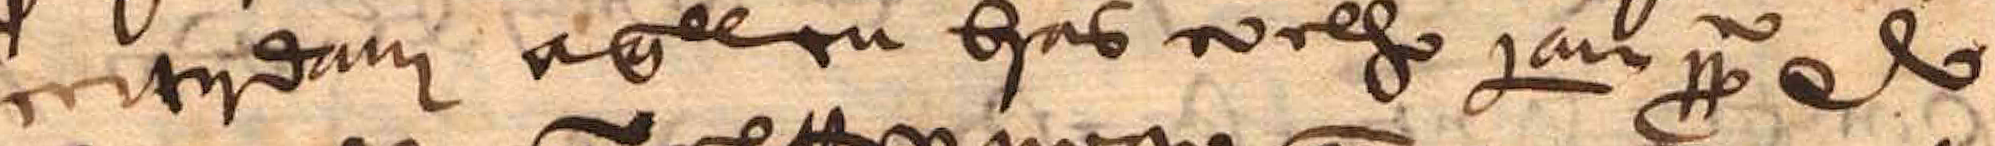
certydam a q̄ll eu bras coelho tam ꝓpco e do
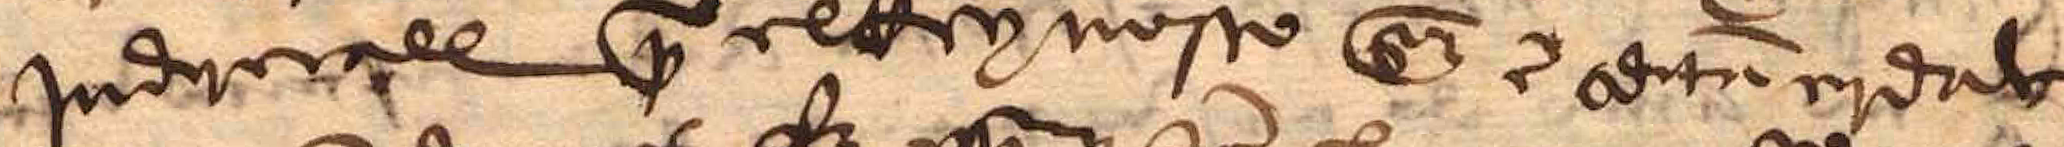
Judyciall p̄o el Rey nosso s̄or ē a dita cjdade
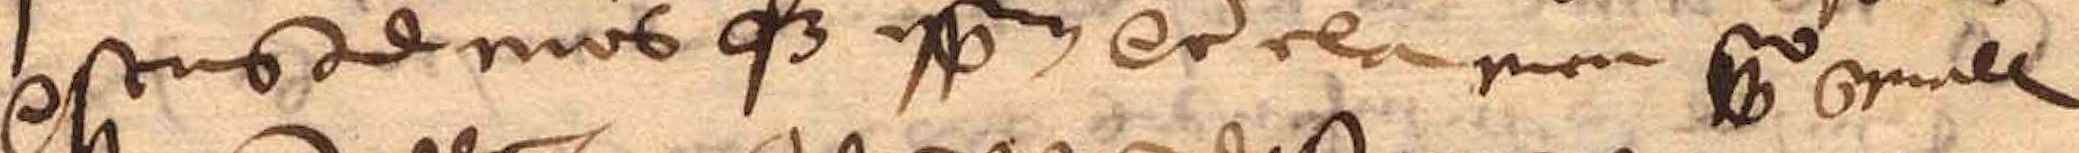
e seus t̄mos fiz esp̄uy e ē ela meu ꝓpco synall
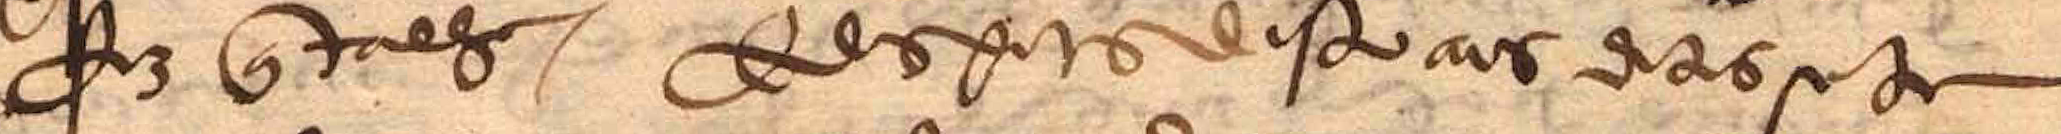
fiz q̄ tal he / E despojs desto aos ditos sete
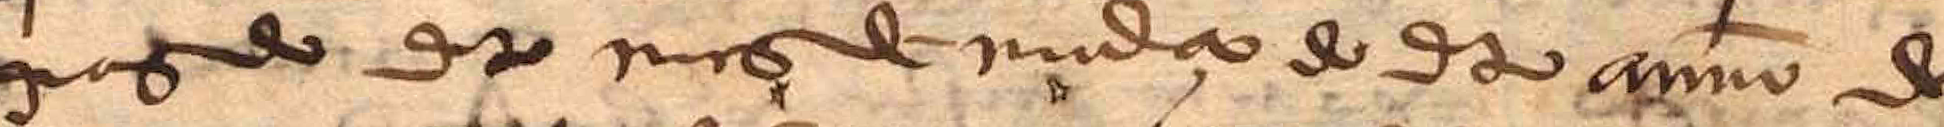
dias do dito mes de māço do dito anno de
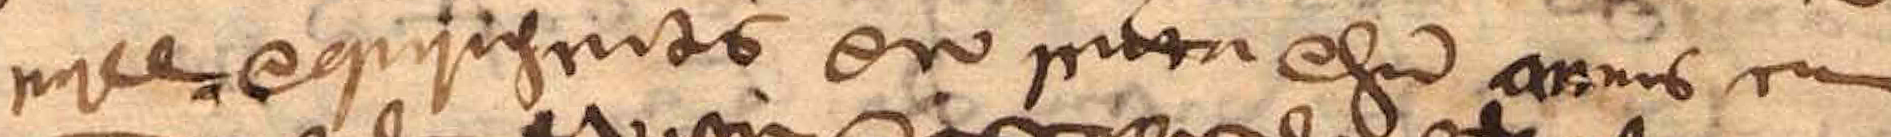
mjll e qujnhentos e corenta e hū annos em
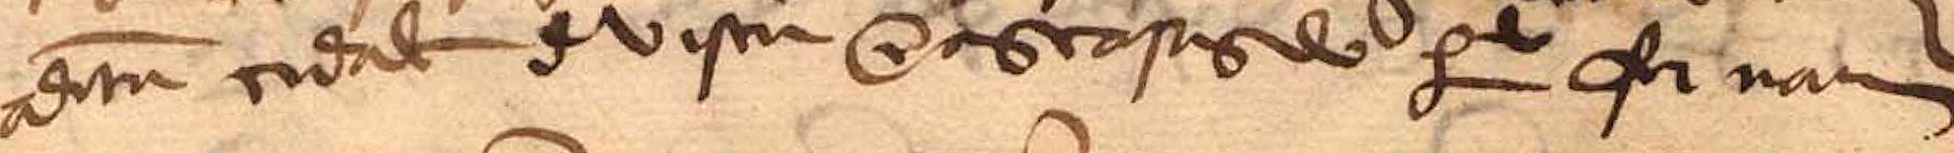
a dita cidade de viseu ē as casas do Ldo fernam
